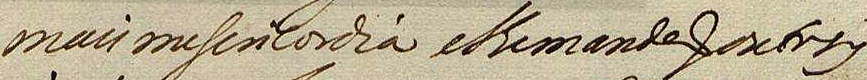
mais misericordia e lhe mandaõ outrosy
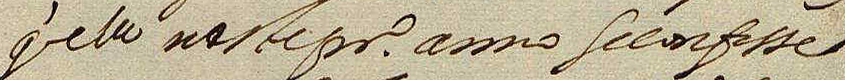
q̄ elle neste pr.o anno se confesse
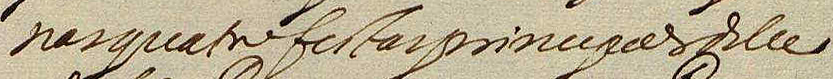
nas quatro festas principaes delle
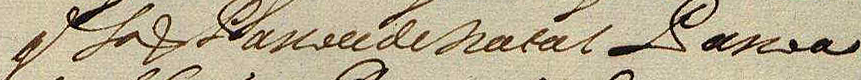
q̄ saõ Pascoa de natal Pascoa
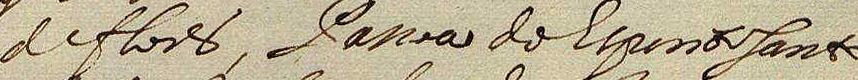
de flores, Pascoa do Espirito santo
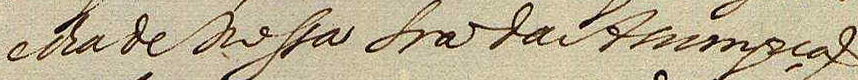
e da de nossa sra da Asumpçaõ
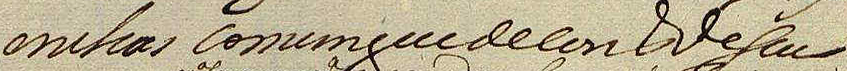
e nelas comungue de conso de seu
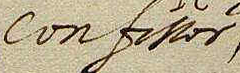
confessor
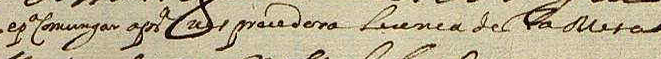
e pa Comungar a pra ues precedera Lecenca desta Mesa
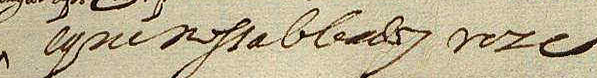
e que nos sabbados reze
